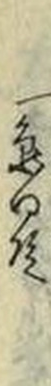藤田殿
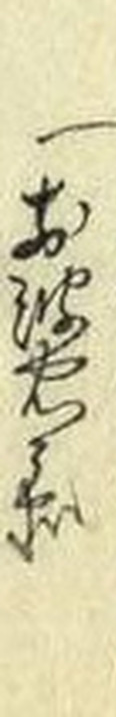前波忠兵衛
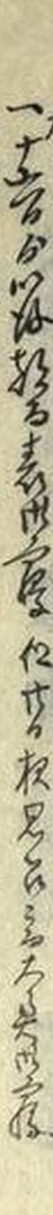一九月十六日ゟ以後都而表御寝但廿日夜思召ニ而大奥御寝
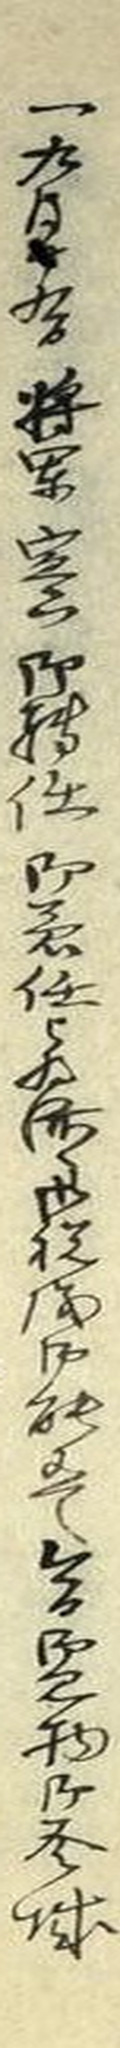一九月十九日将軍宣下御転任御兼任被為済候御祝儀御能有之今日御見物御登城
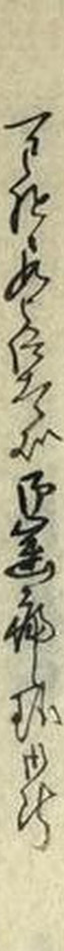可被遊候段被仰出候処御歯痛之趣御断
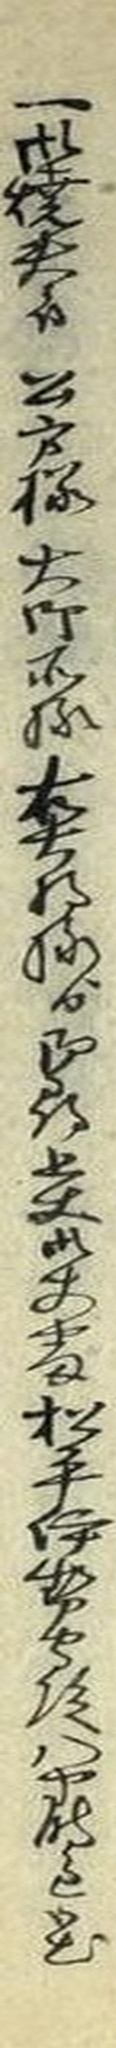一御焼失ニ付公方様大御所様右大将様ゟ御尋上使御使番松平伊勢守殿八半時過被出
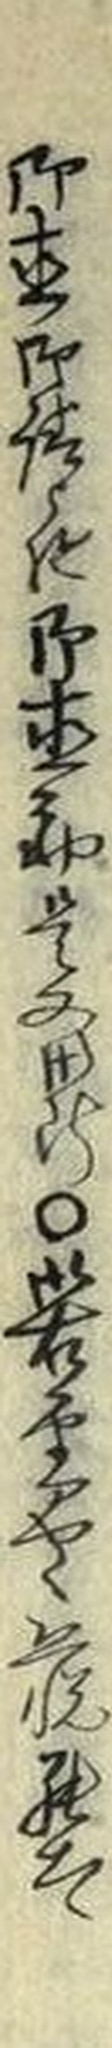御直御請被遊御直勤是又御断〇御右筆部屋へ恐悦罷出候
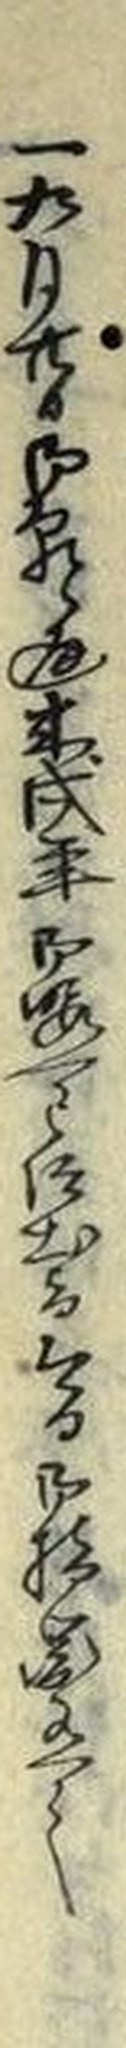一九月廿日御願之通来戌年御暇可被仰出旨今日御指図有之

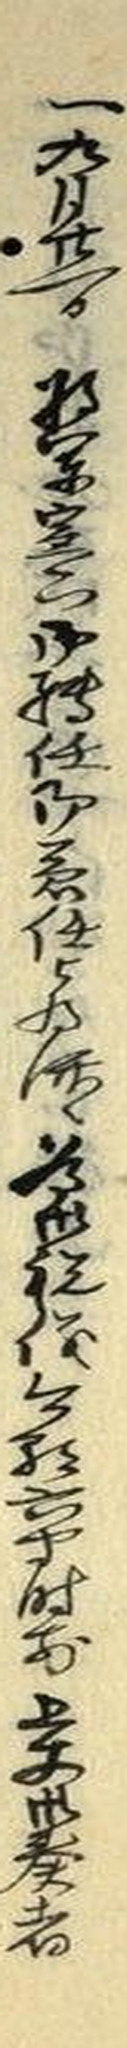一九月廿一日将軍宣下御転任御兼任被為済候為御祝儀今朝六半時前上使御奏者
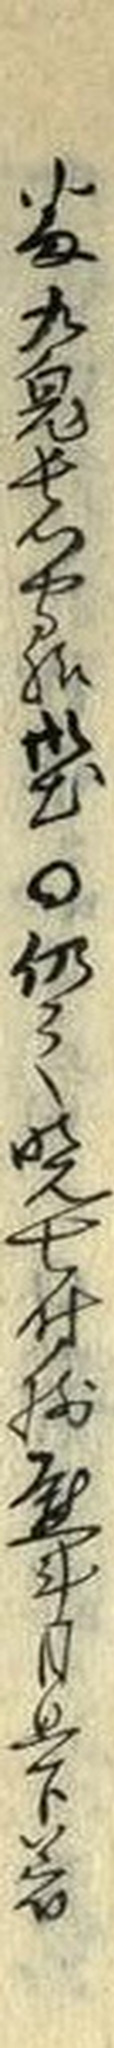番九鬼長門守様御出〇依之暁七時揃熨斗目上下着
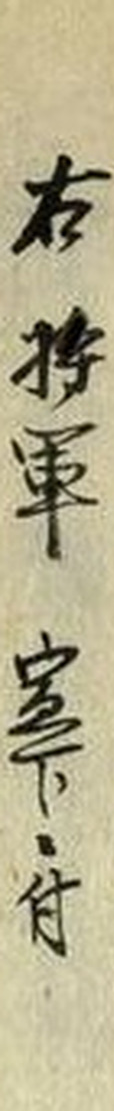右将軍宣下ニ付
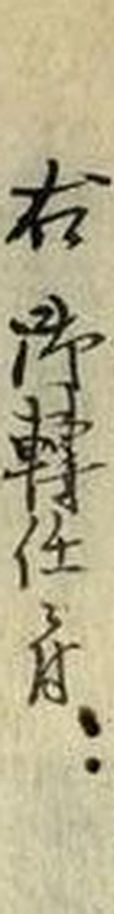右御転任ニ付
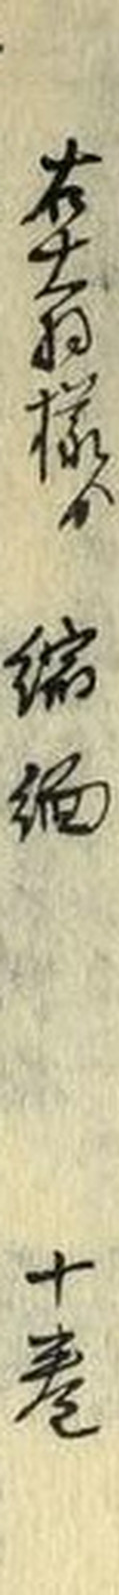右大将様ゟ縮緬十巻
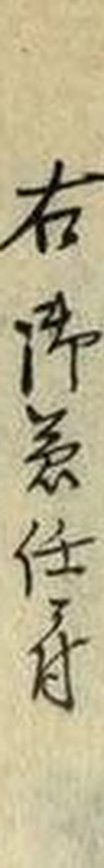右御兼任ニ付
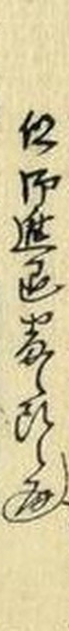但御進退番之頭之通
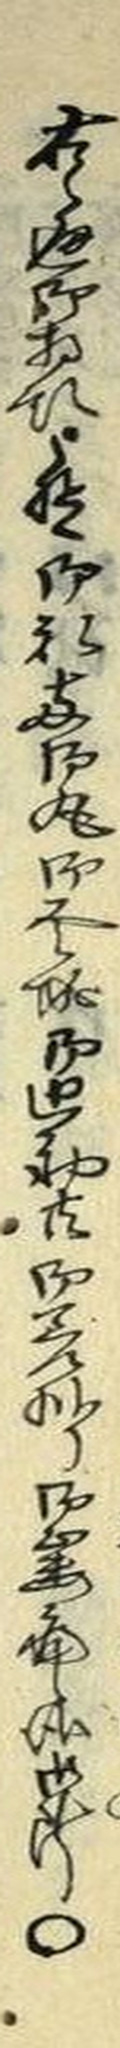右之通御拝領被遊候御礼両御丸御登城御廻勤共御差掛り御歯痛之趣御断〇
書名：少傅日録抄（斉善付側向頭取日記、在府）
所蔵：福井県文書館 Fukui Prefectural Archives
